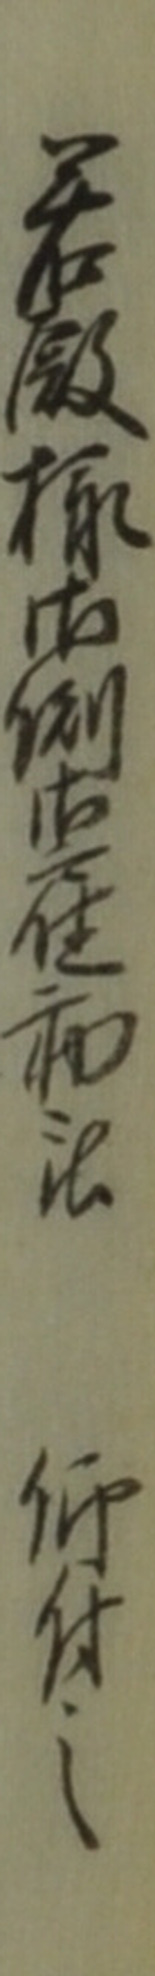若殿様御側御雇勤被仰付之
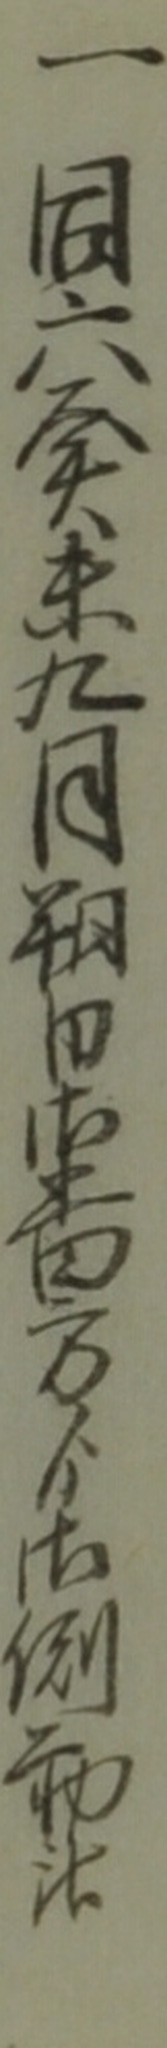一同六癸未九月朔日御番方ゟ御側勤被
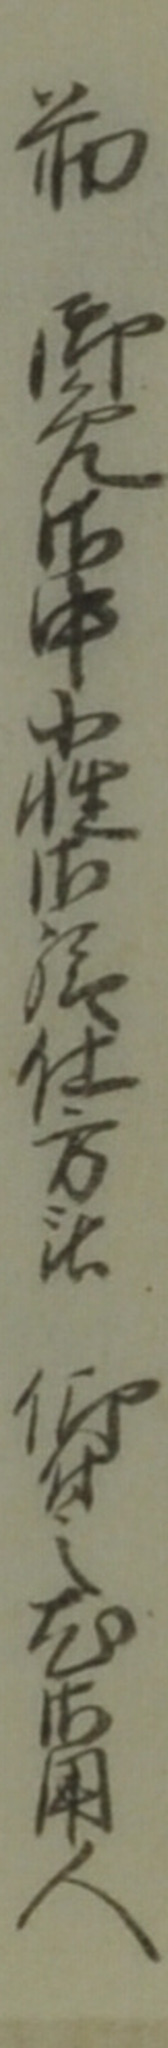勤御免御中小性御給仕方被仰付之尤御用人
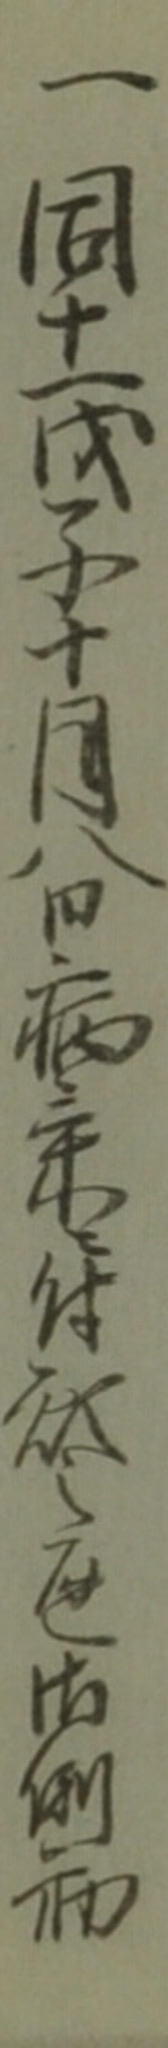一同十一戊子十月八日病気ニ付願之通御側勤
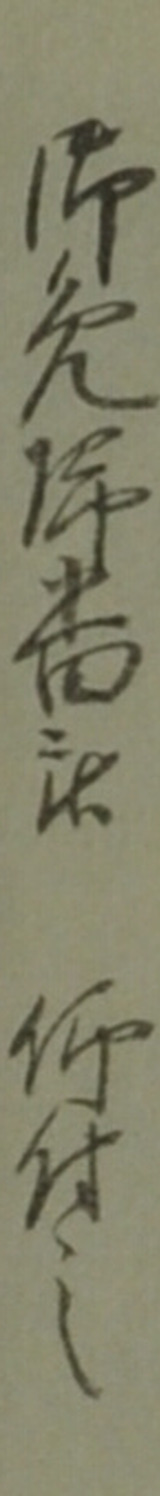御免帰番被仰付之
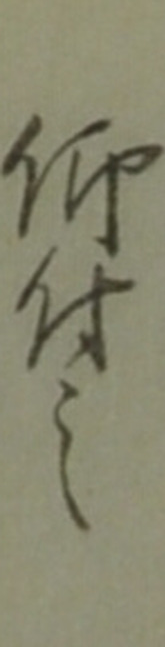仰付之
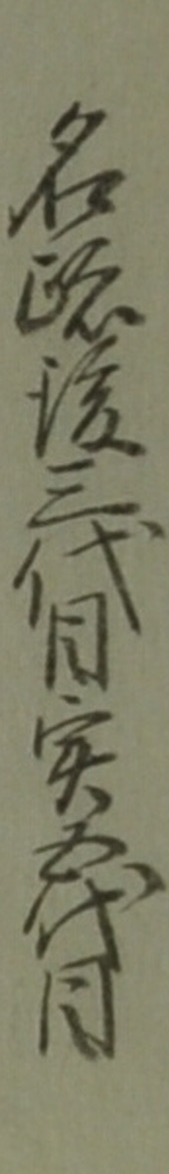名跡後三代目実五代目
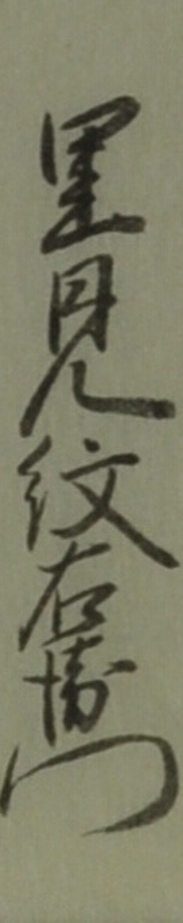里見紋右衛門
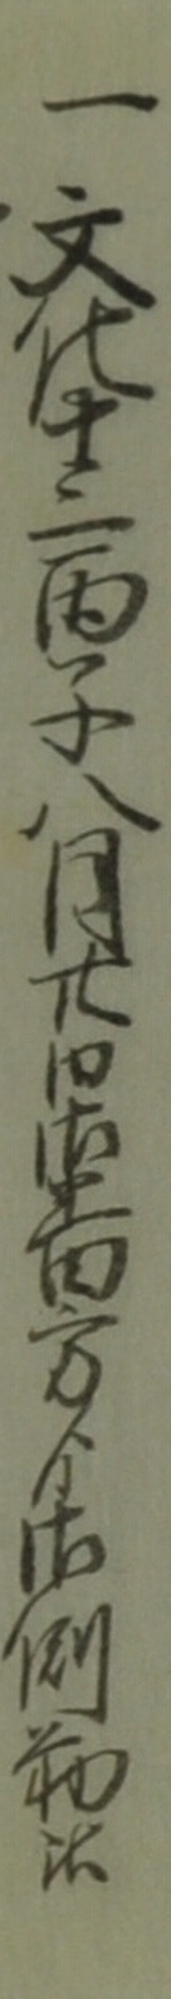一文化十三丙子八月廿日御番方ゟ御側勤被
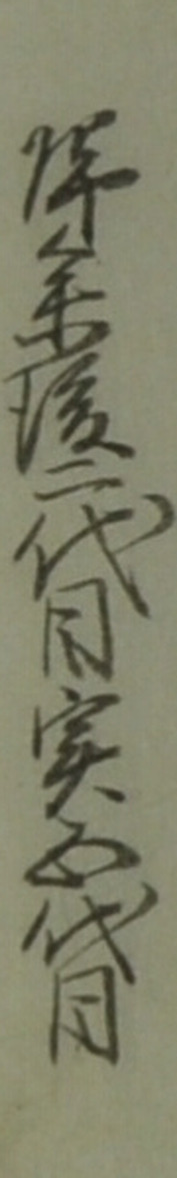帰参後二代目実五代目
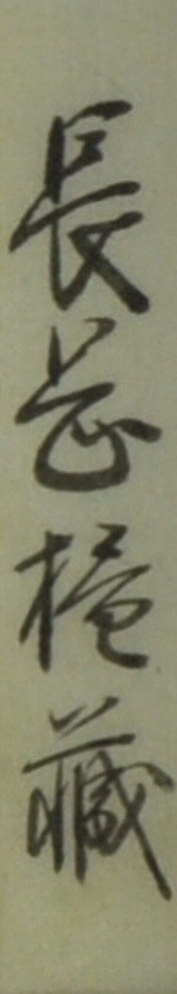長岡権蔵

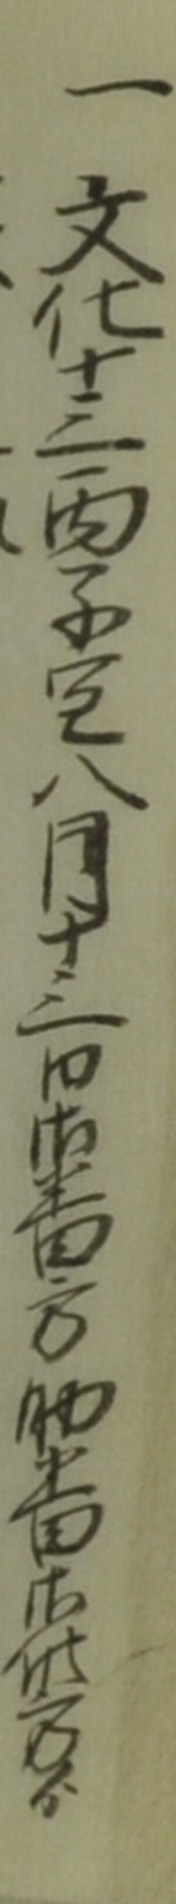一文化十三丙子閏八月十三日御番方助番御供方ゟ
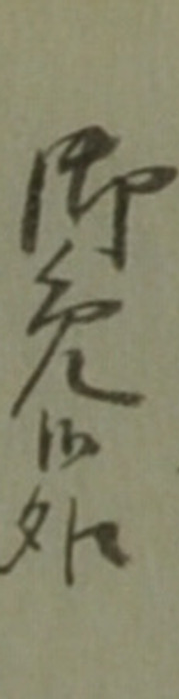御免候処
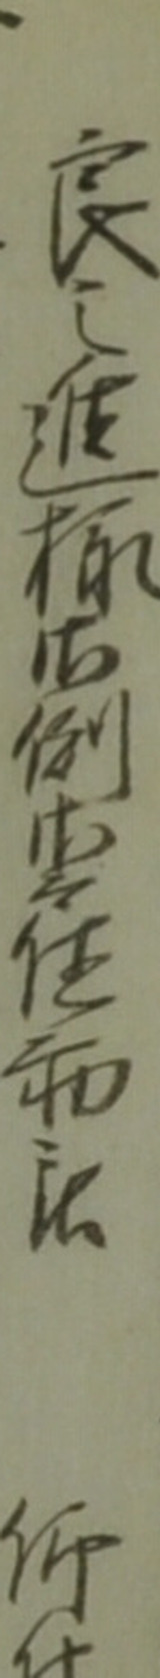良之進様御側御雇勤被仰付之
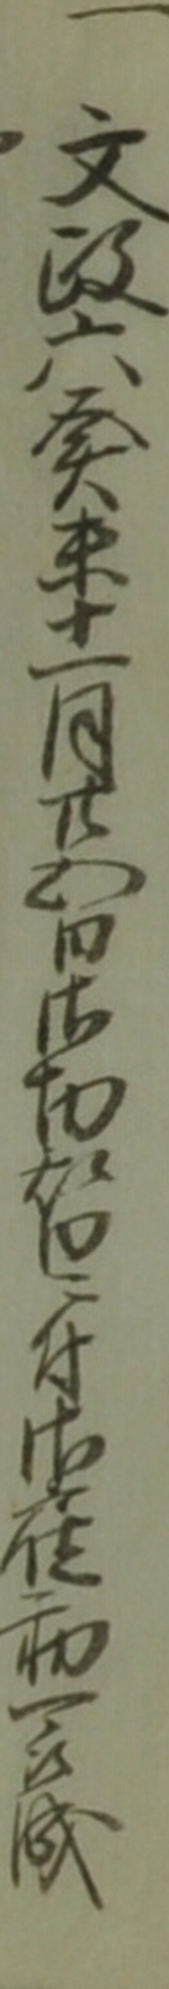一文政六癸未十一月廿五日御切替ニ付御雇勤可被成
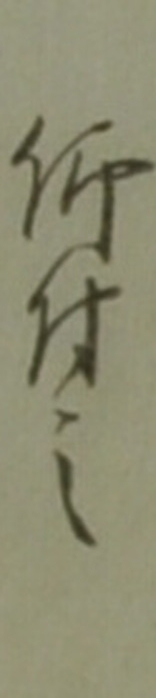仰付之
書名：諸御役代々録（五）
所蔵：伊那市立高遠町図書館・合同会社AMANE
